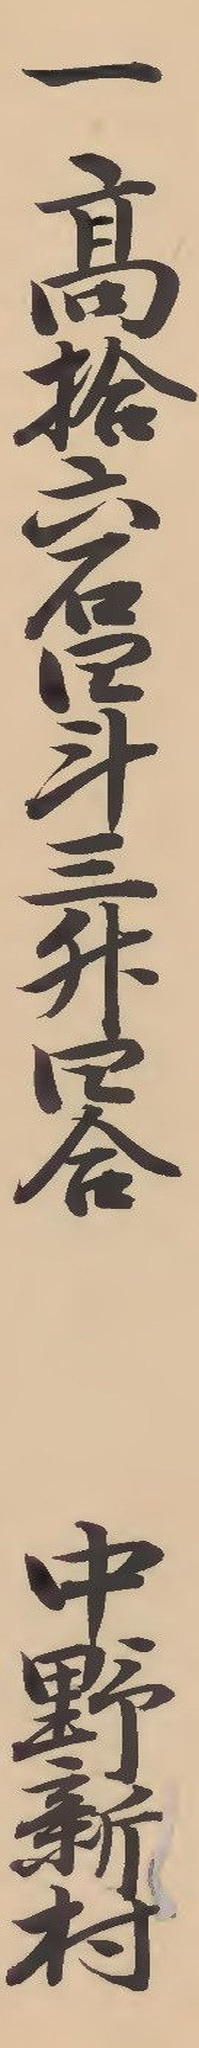一高拾六石四斗三升四合中野新村
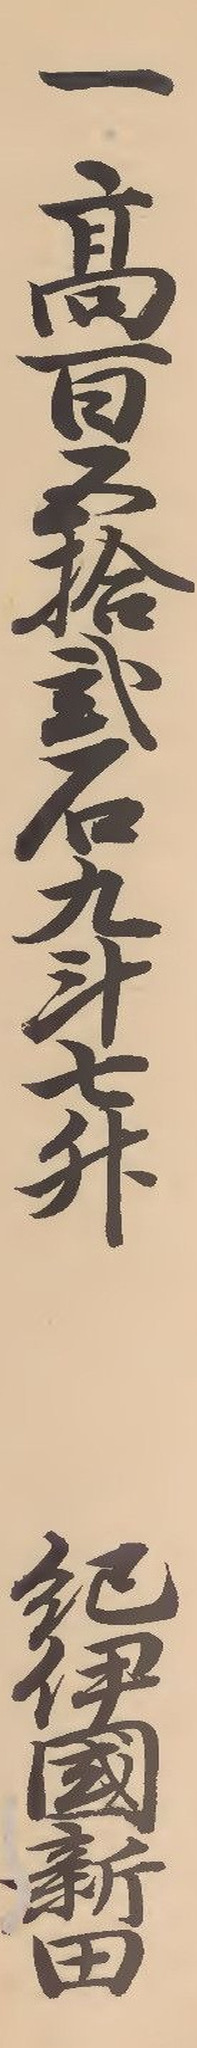一高百五拾弐石九斗七升紀伊国新田
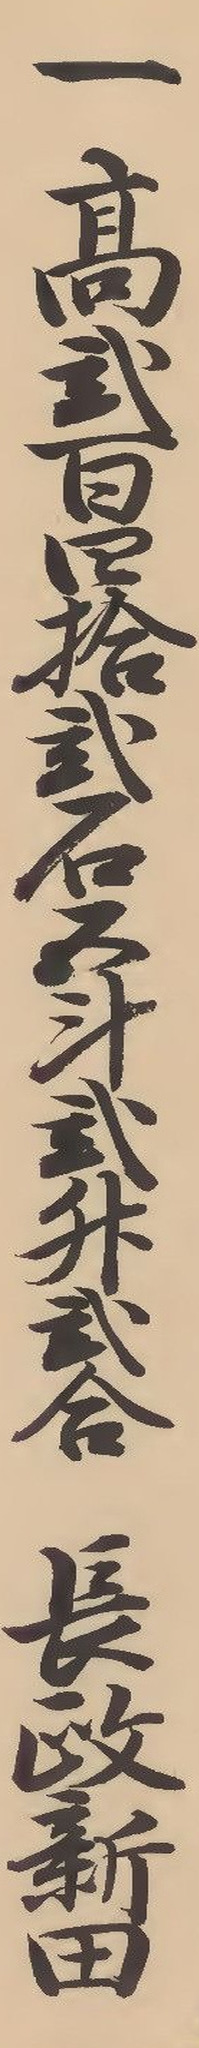一高弐百四拾弐石五斗弐升弐合長政新田
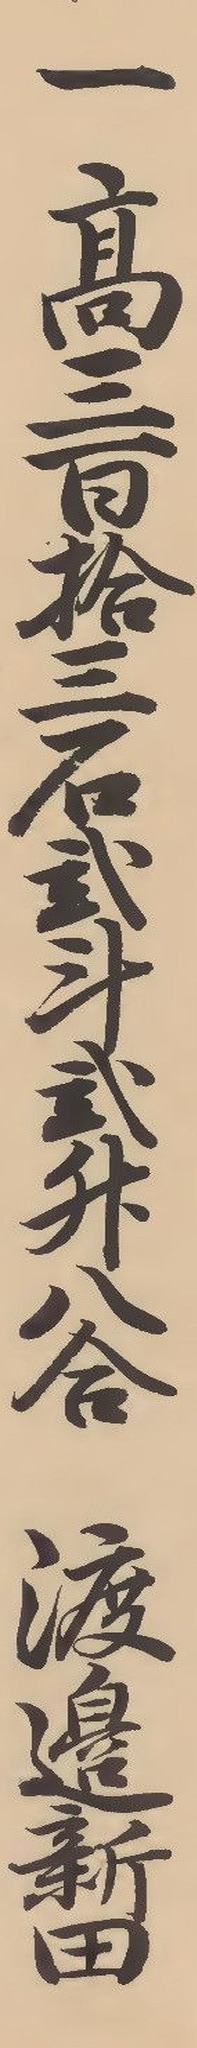一高三百拾三石弐斗弐升八合渡辺新田
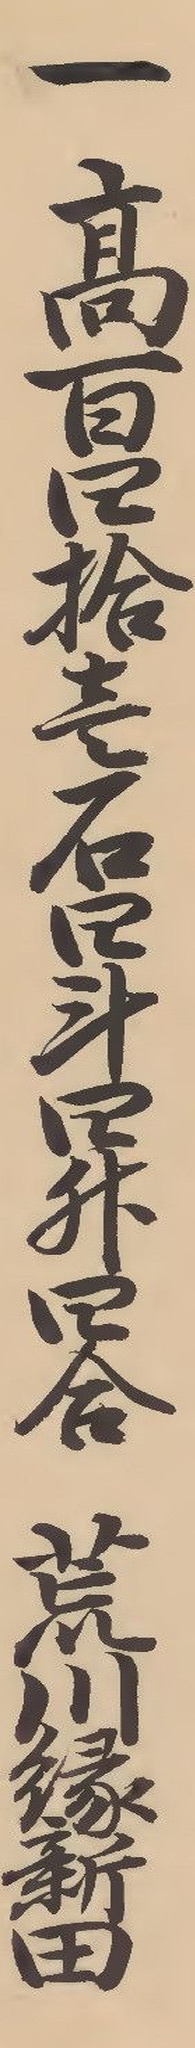一高百四拾壱石四斗四升四合荒川縁新田

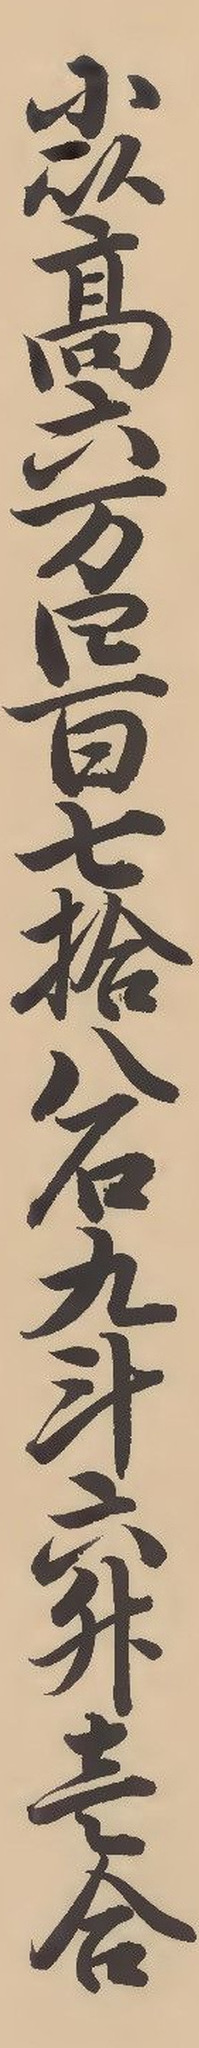小以高六万四百七拾八石九斗六升壱合
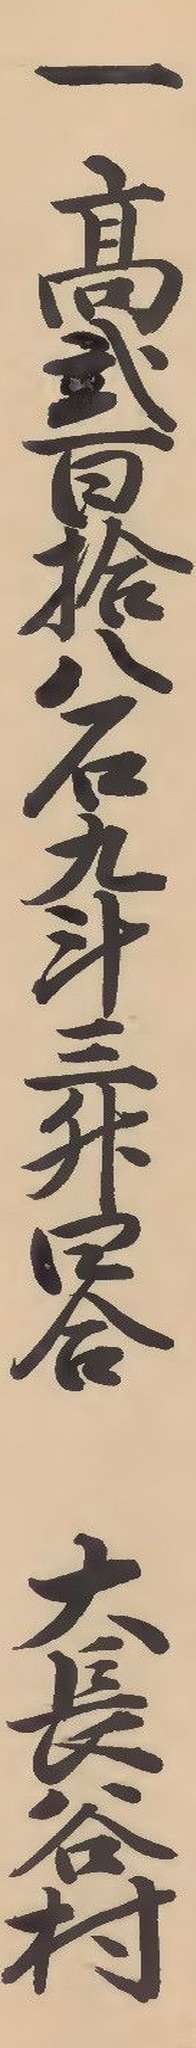一高弐百拾八石九斗三升四合大長谷村
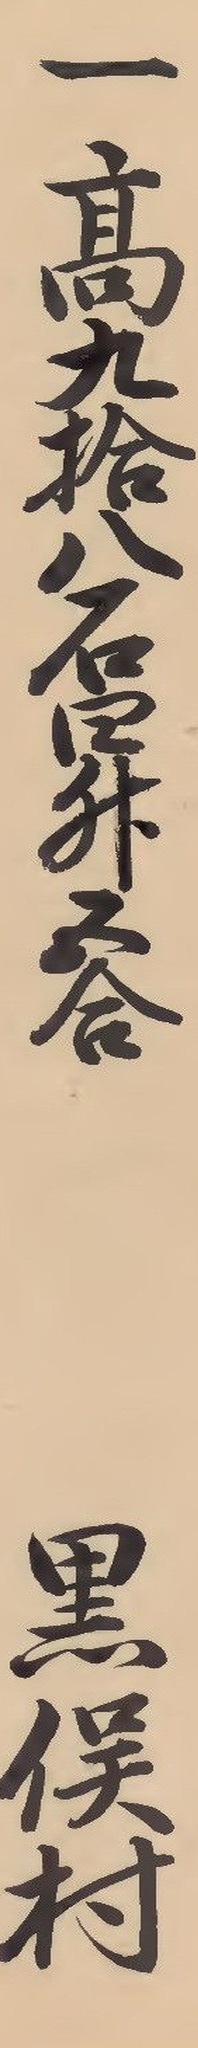一高九拾八石四升五合黒俣村
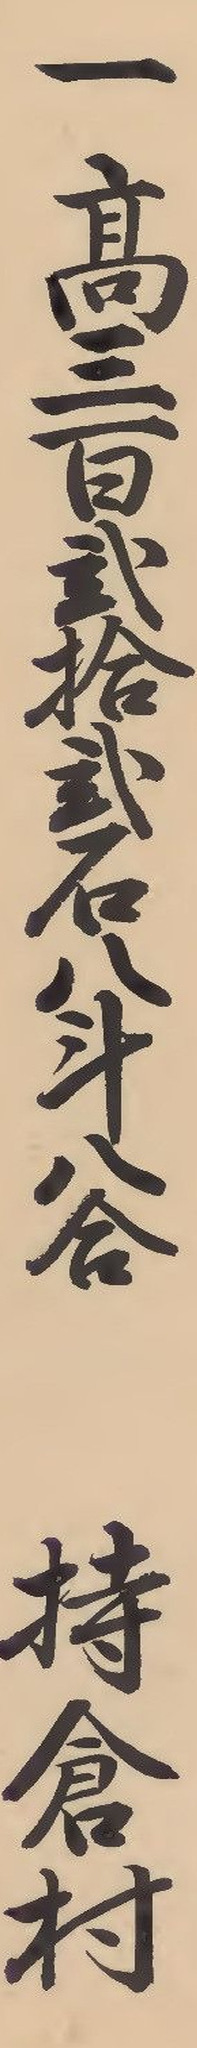一高三百弐拾弐石八斗八合持倉村

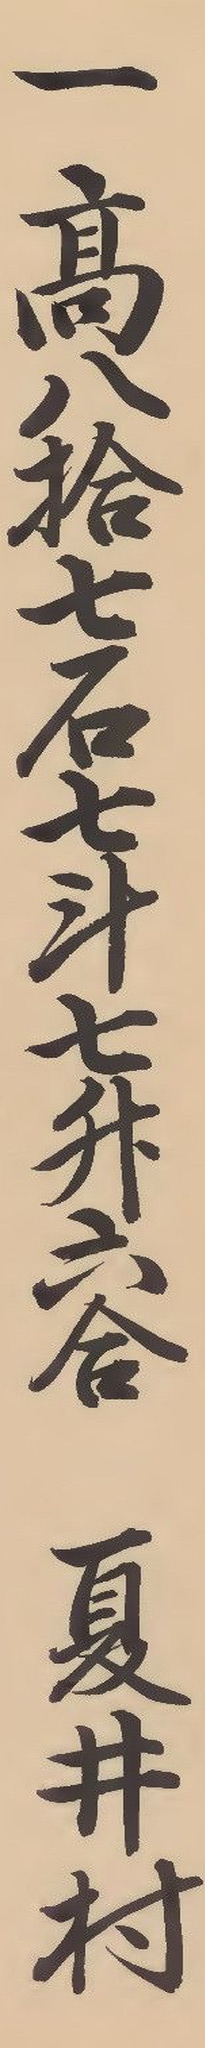一高八拾七石七斗七升六合夏井村
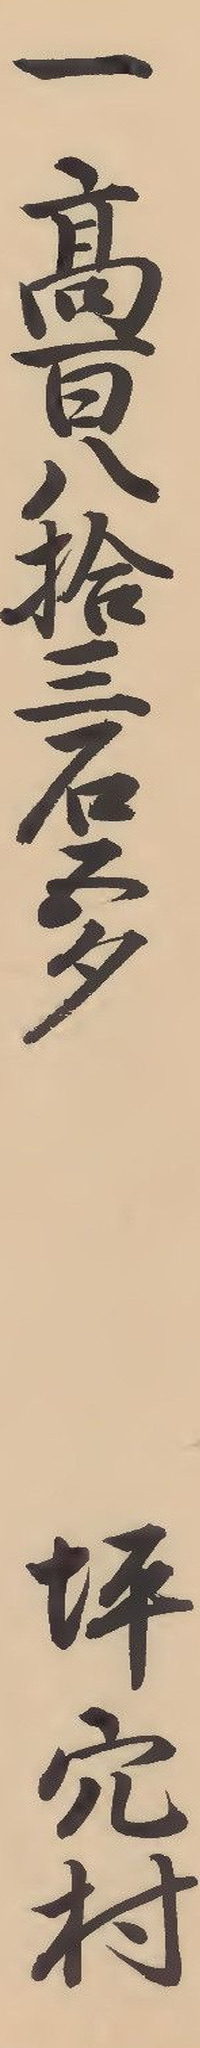一高百八拾三石五勺坪穴村
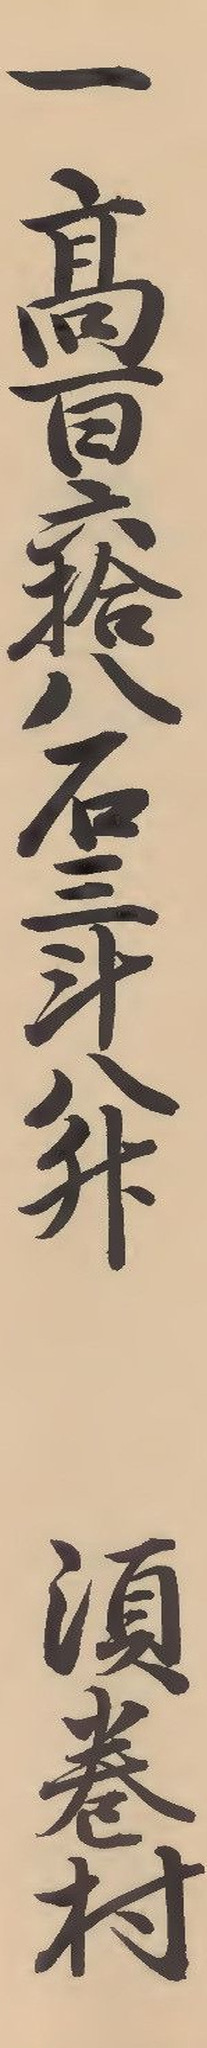一高百六拾八石三斗八升須巻村
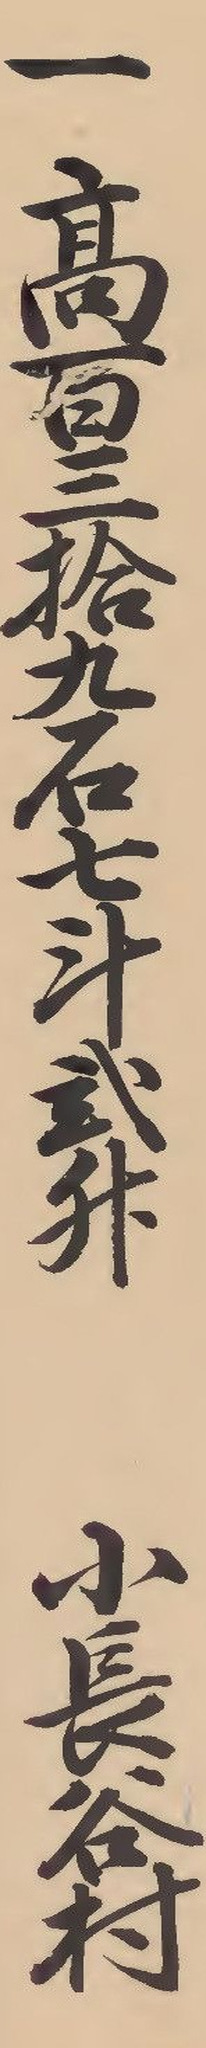一高百三拾九石七斗弐升小長谷村
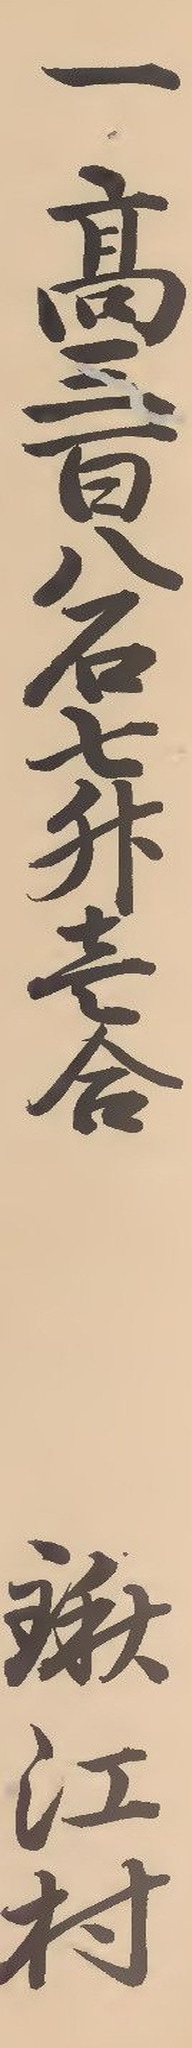一高三百八石七升壱合鍬江村
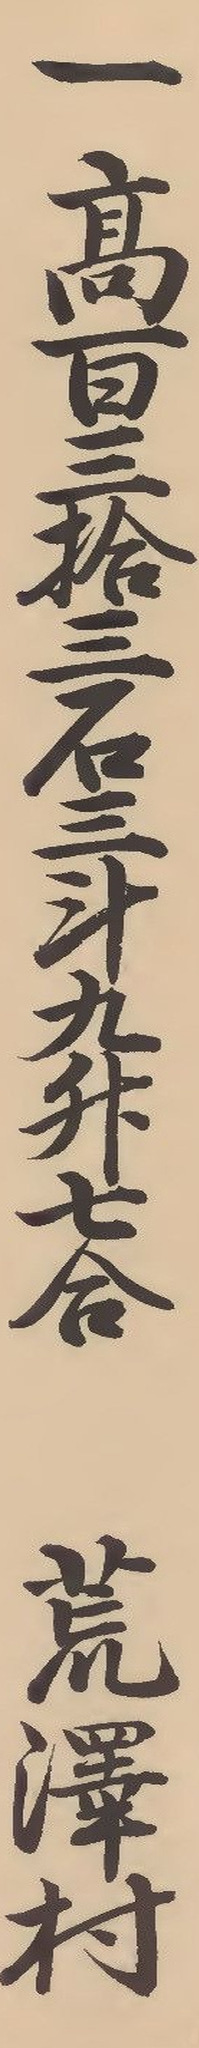一高百三拾三石三斗九升七合荒沢村
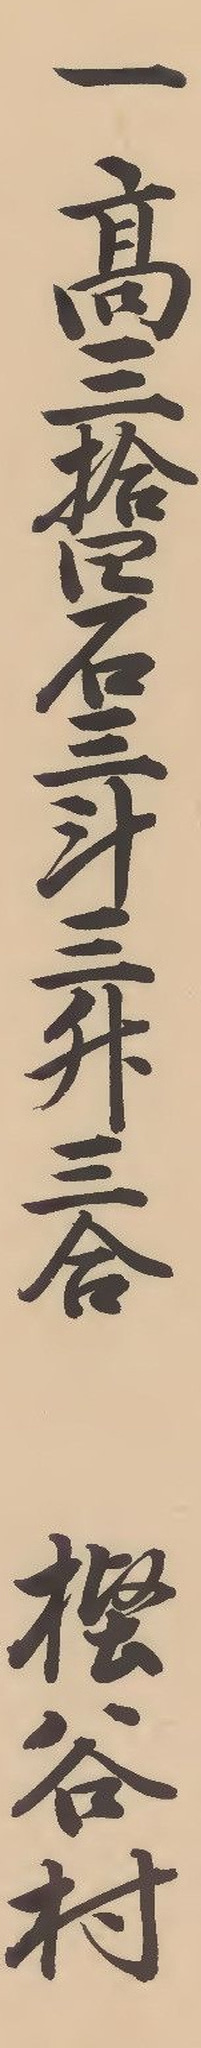一高三拾四石三斗三升三合樫谷村
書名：越後国郷帳　下
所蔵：国立公文書館 National Archives of Japan
